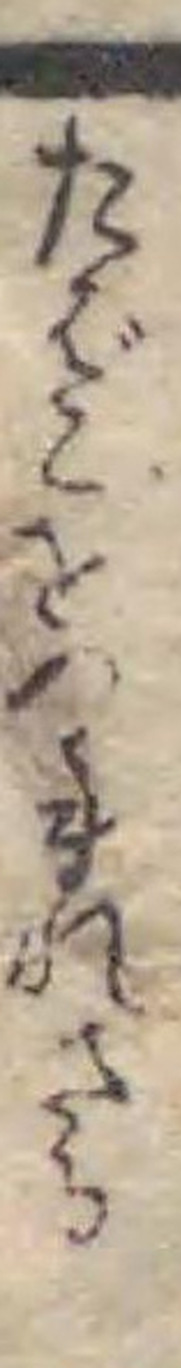たばこをつゝまれたる
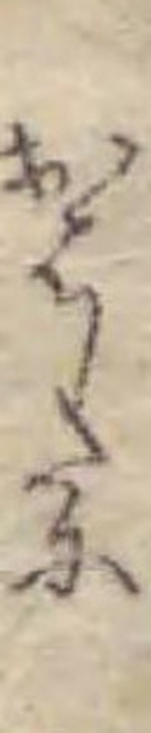おはしたに
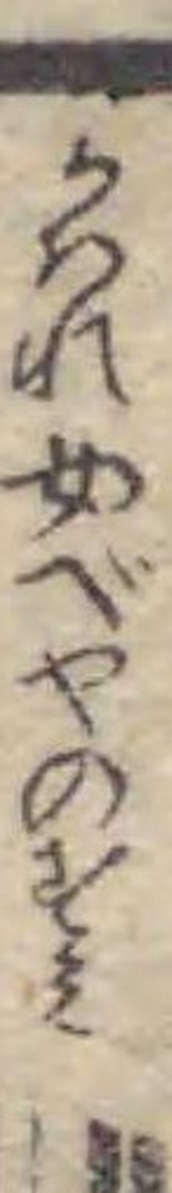かはれ女べやのすみ
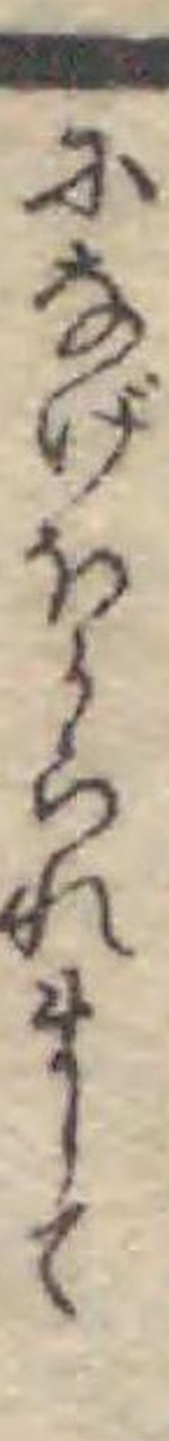になげほうられまして
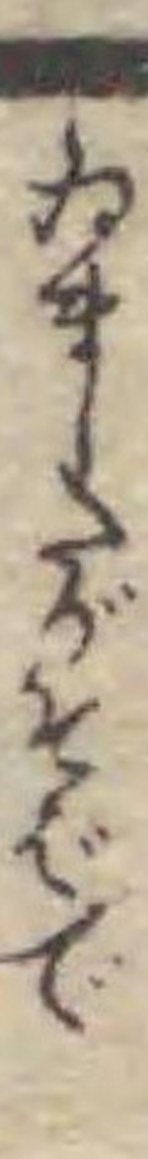ゐましたがそばで
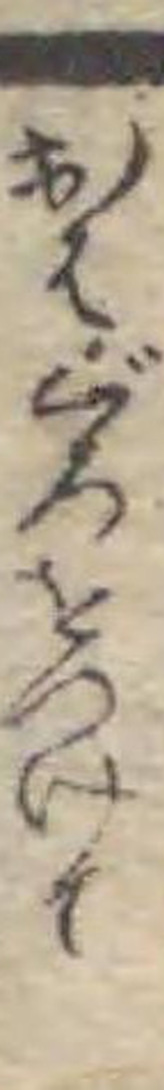おはぐろをつけて
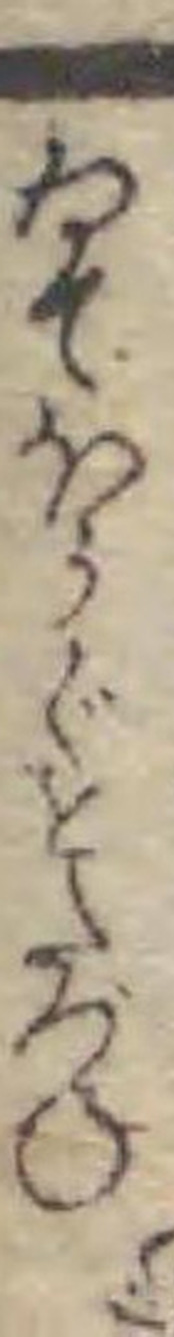ゐてほう〴〵をたづね
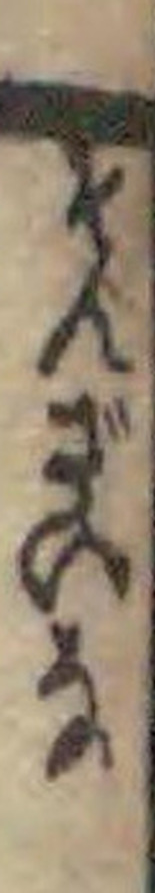そんざいな
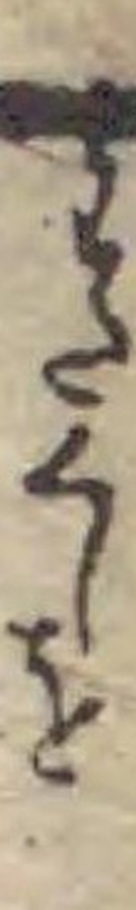わたくしを
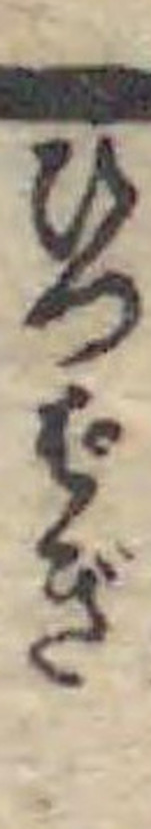ひつぱぎ
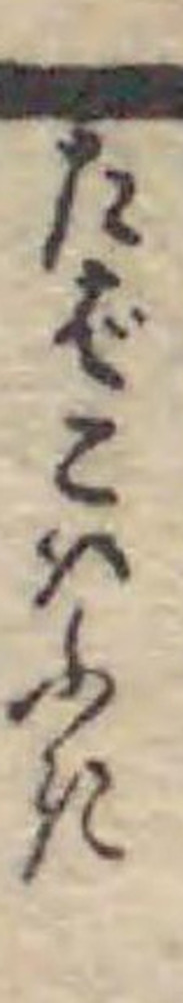たばこはふき
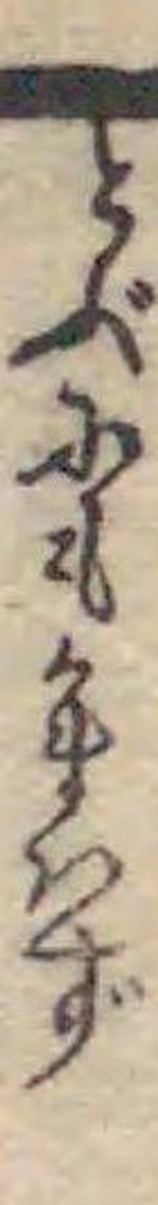とぶにもかまはず
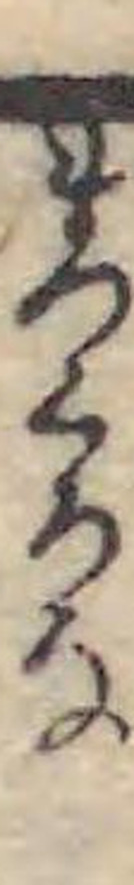まつくろな
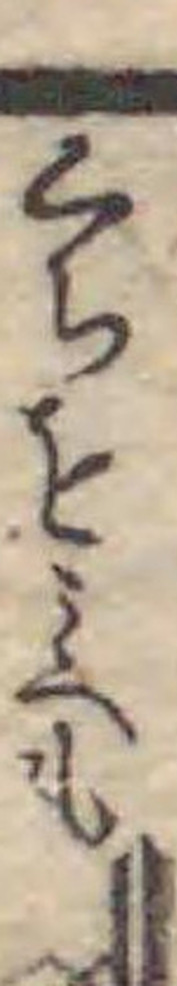くちをみへも
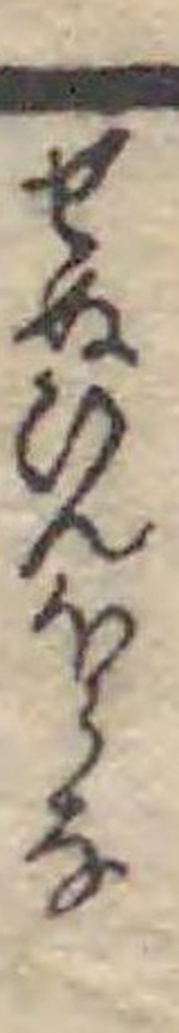せぬひんほうな
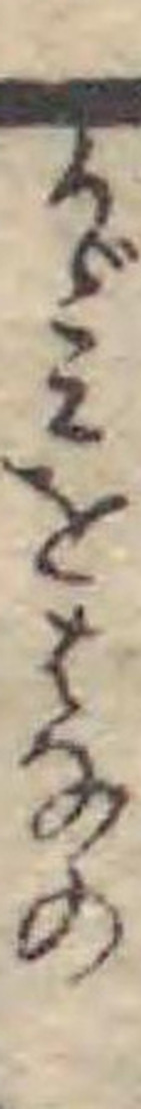かゞみをはなの
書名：紙屑身上噺 : 3巻
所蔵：国立国会図書館 National Diet Library, JAPAN
